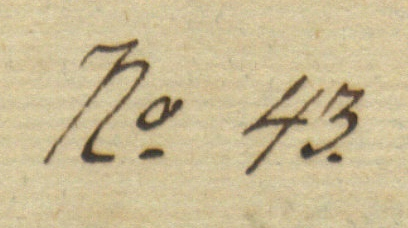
No 43.
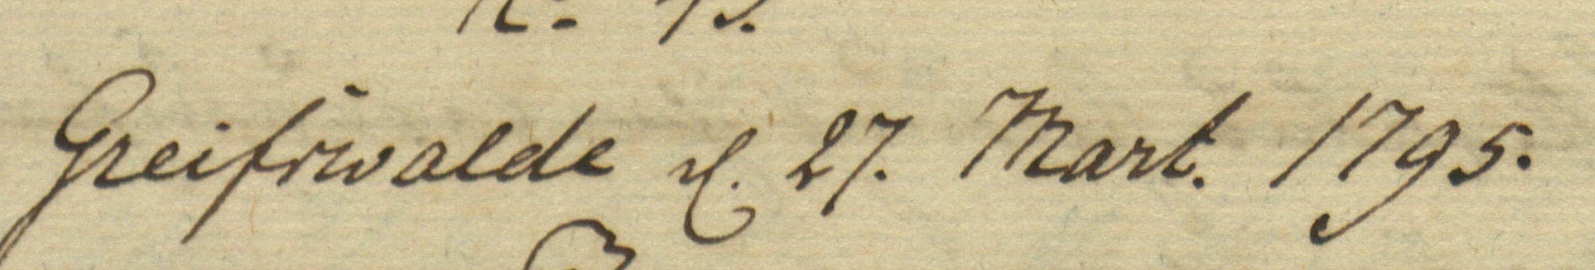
Greifswalde d. 27. Mart. 1795.
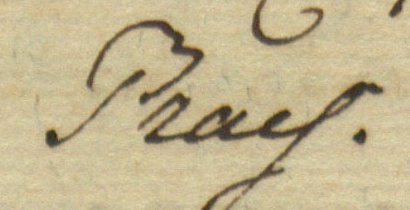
Praes.
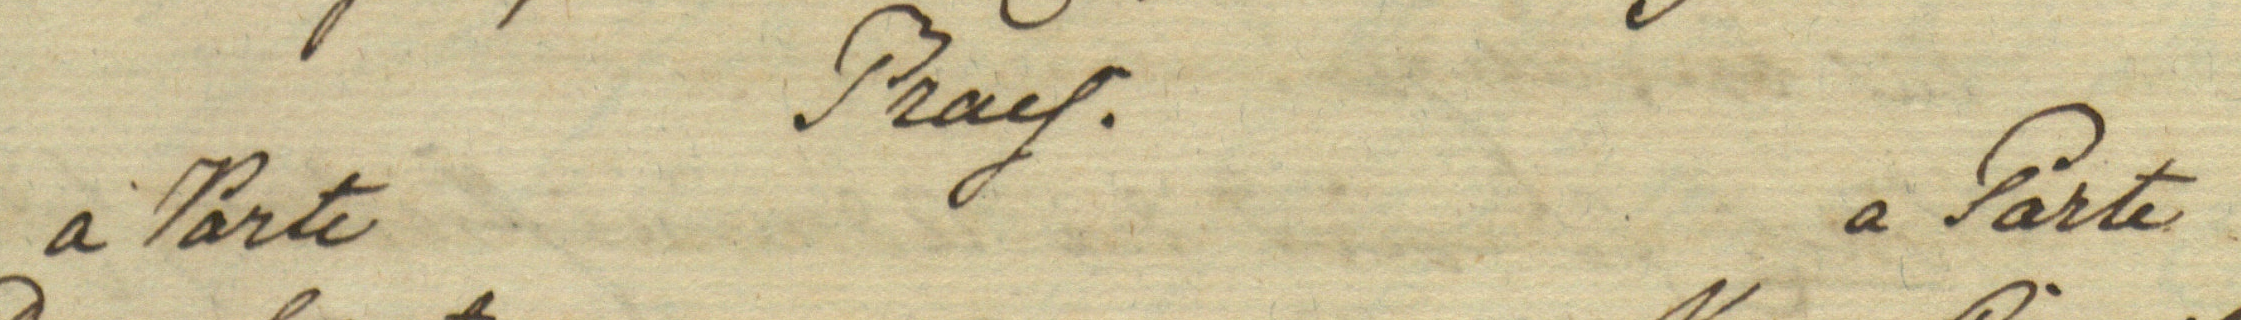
a Parte a Parte
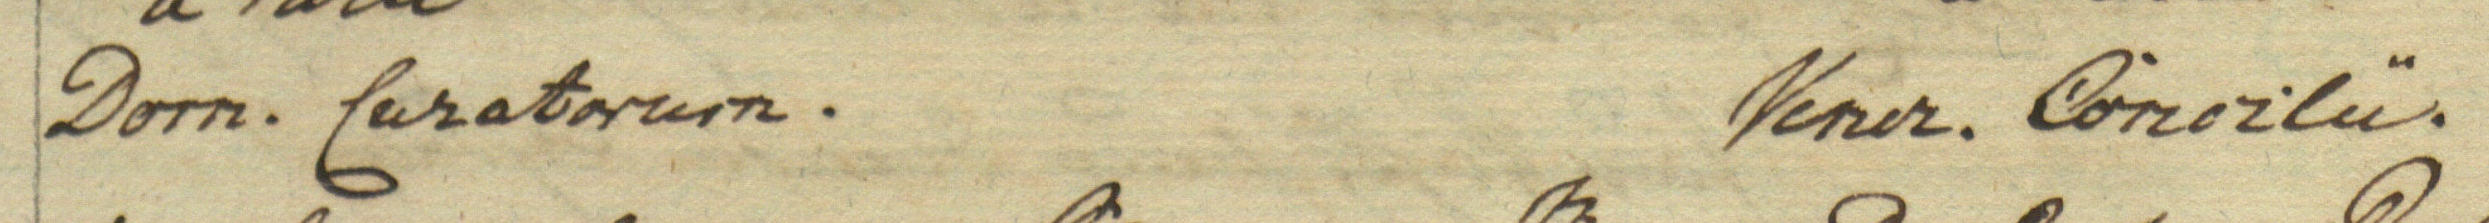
Dom. Curatorum. Vener. Concilii.
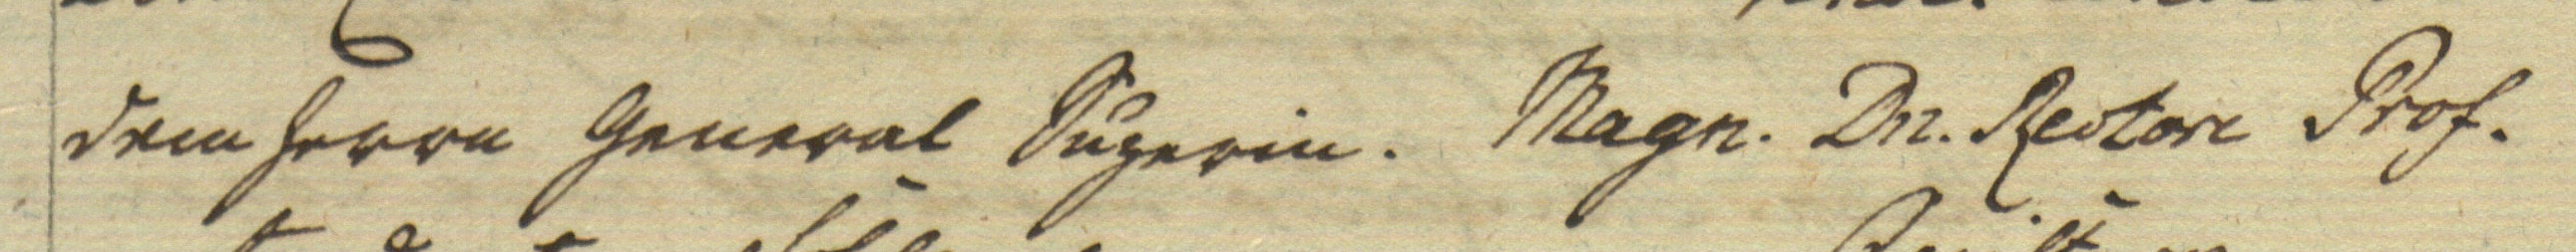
dem Herrn General Superin¬ Magn. Dn. Rectore Prof.
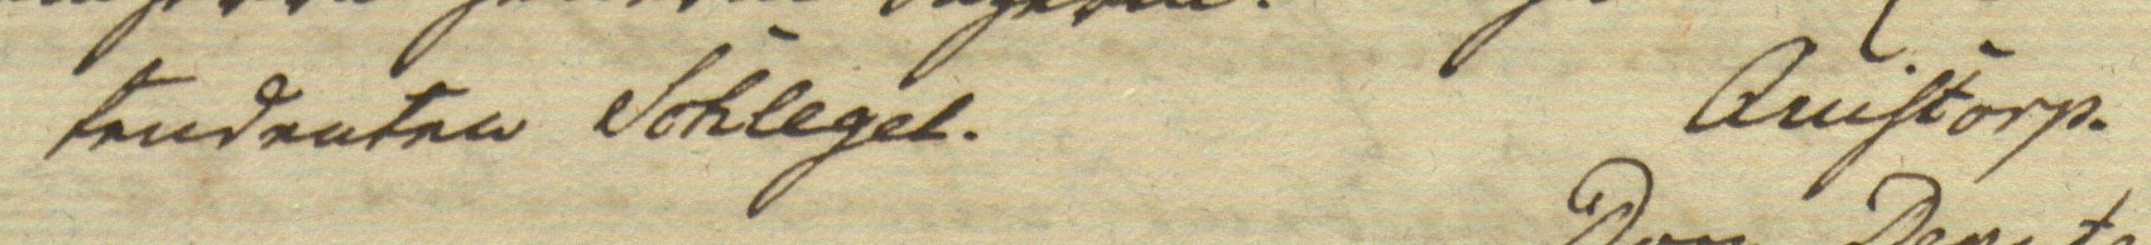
tendenten Schlegel." Quistorp
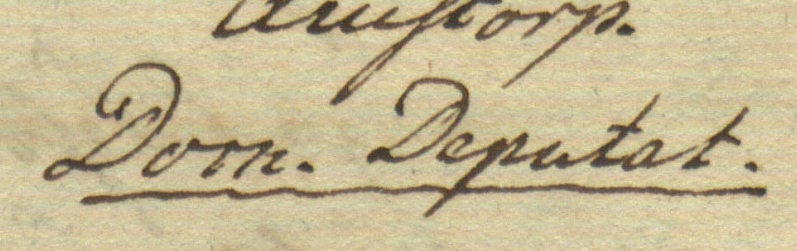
Dom. Deputat.
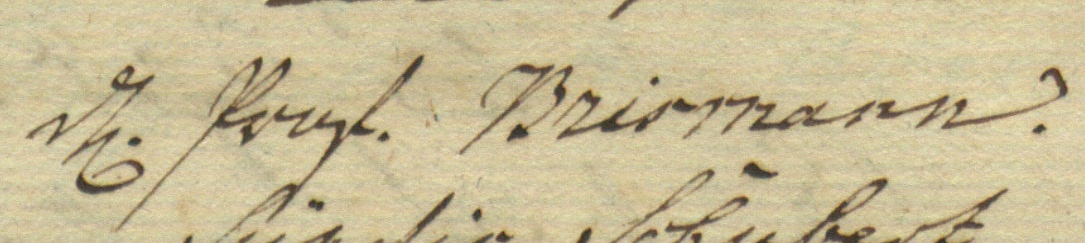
dh. Prof. Brismann.
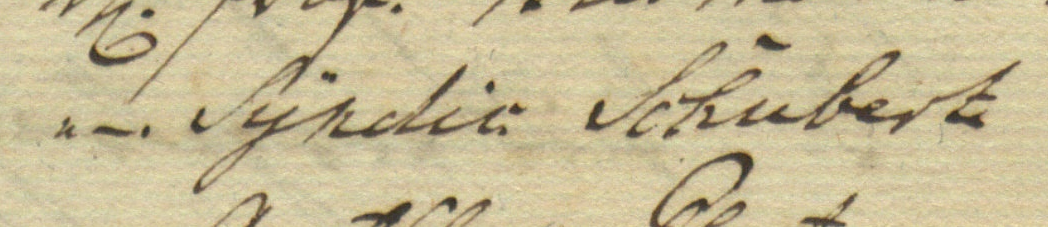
Sÿndic. Schubert.
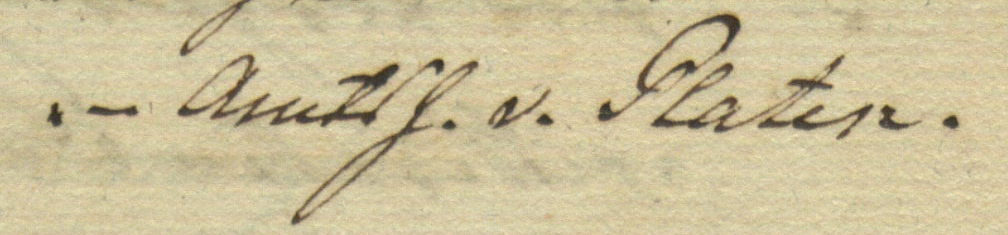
Amtsh. v. Platen.
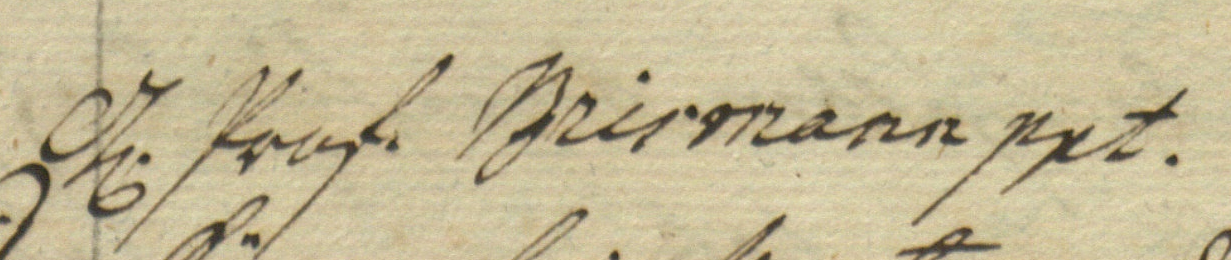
dh. Prof. Brismann ppt.
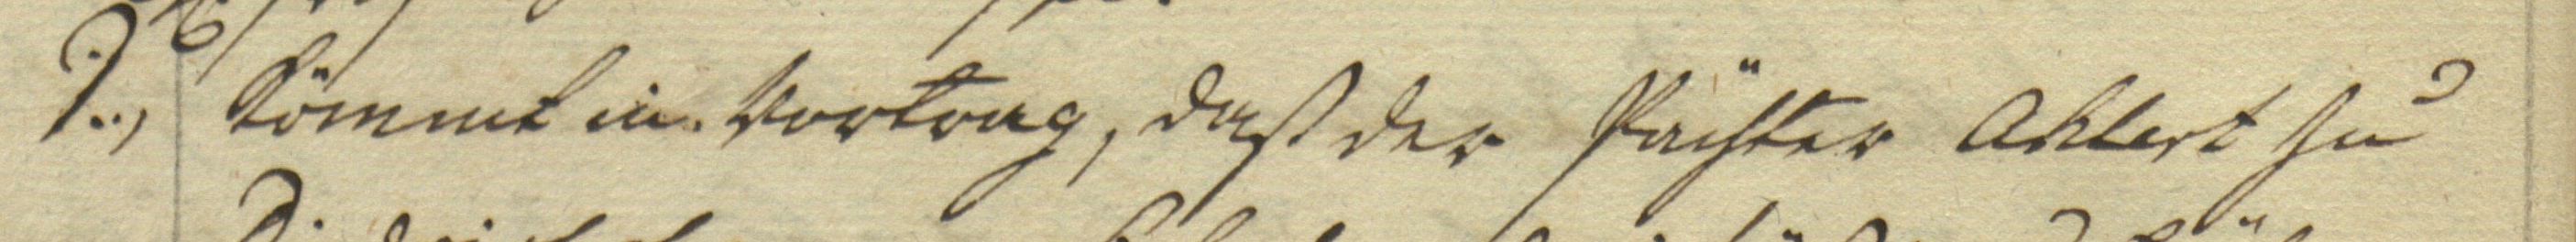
1., Kömmt in Vortrag, daß der Pächter Ahlert zu
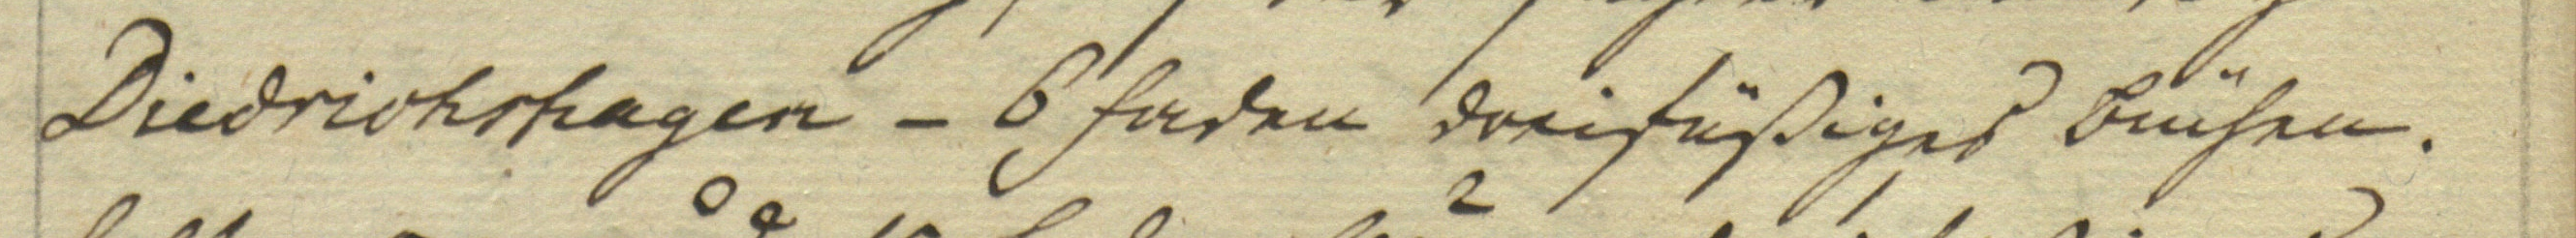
Diedrichshagen 6 Faden dreifüßiges Büchen¬
